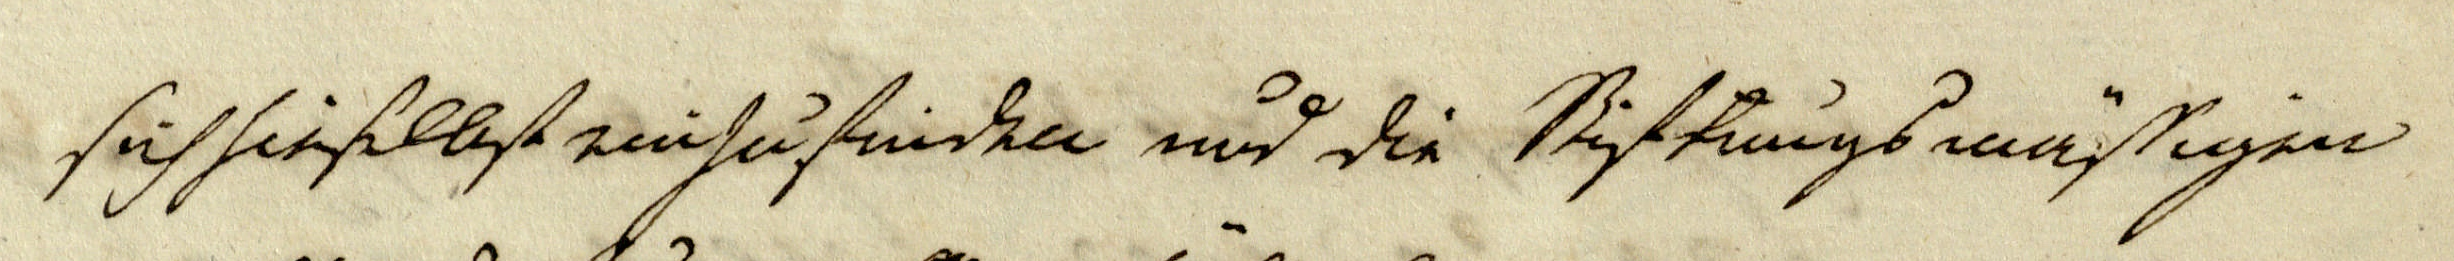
sich hieselbst einzufinden und die Stiftiunpgs mässigen
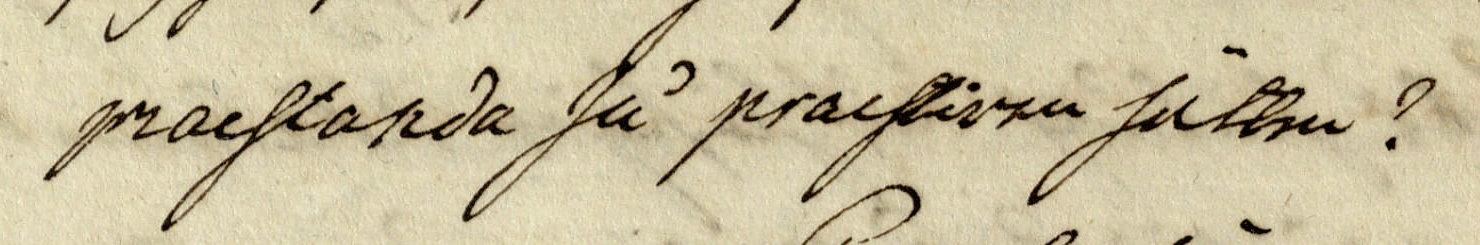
praestanda zu praestiren hätten?
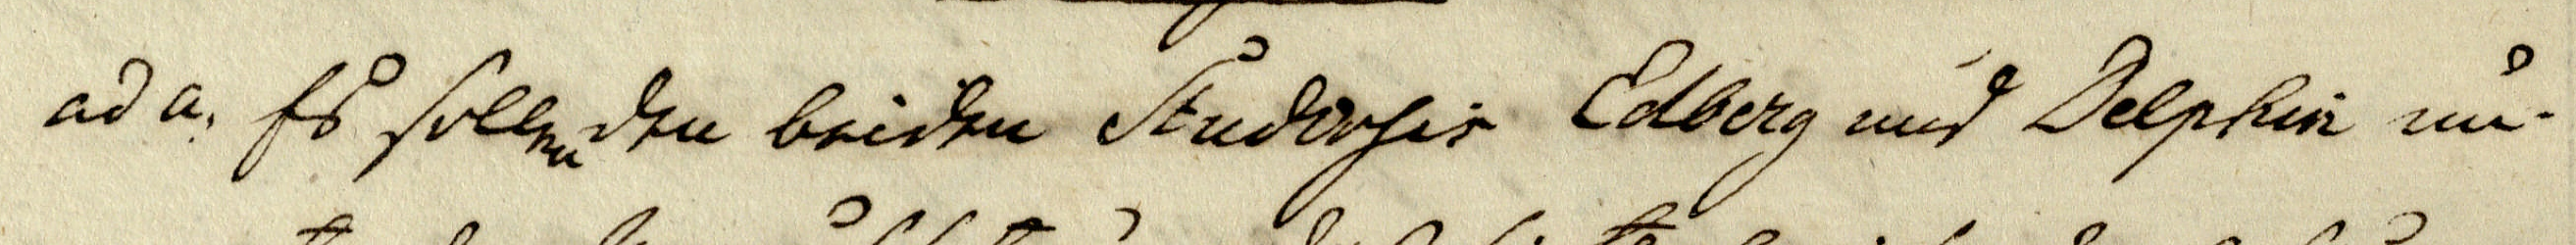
ad a. Es sollen den beiden Studiosis Edberg und Delphin un¬
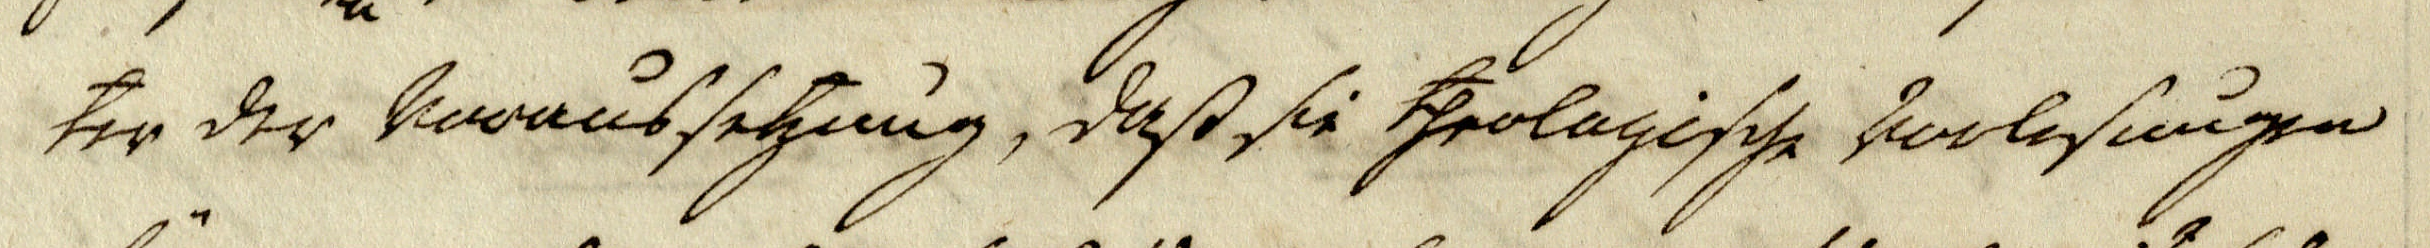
ter der Voraussetzung, daß sie Theologische Vorlesungen
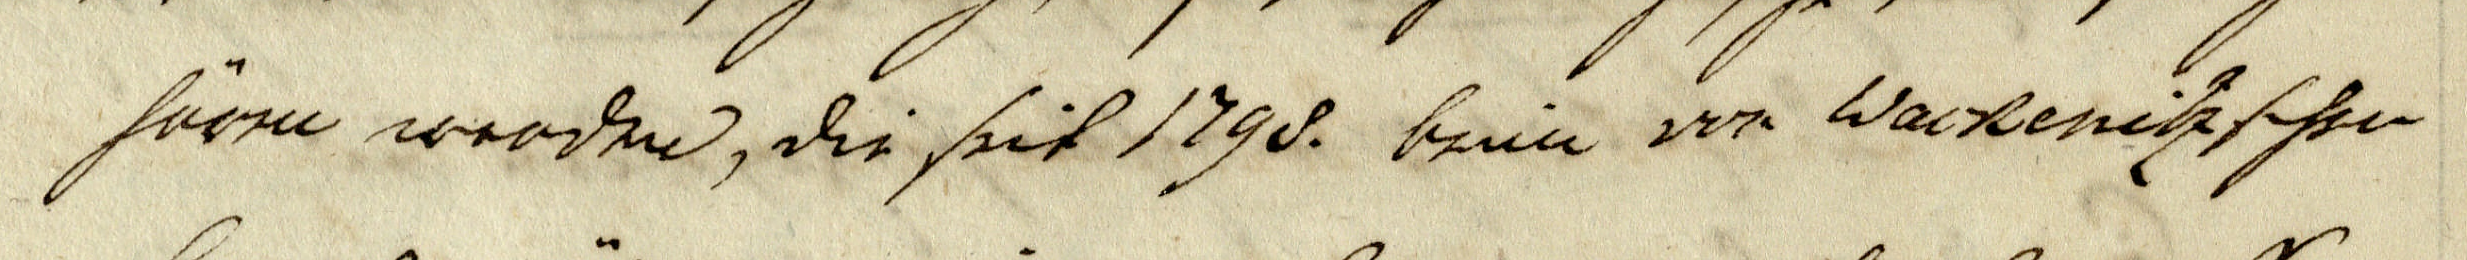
hören werden, die seit 1798. beim von Wackenitzschen
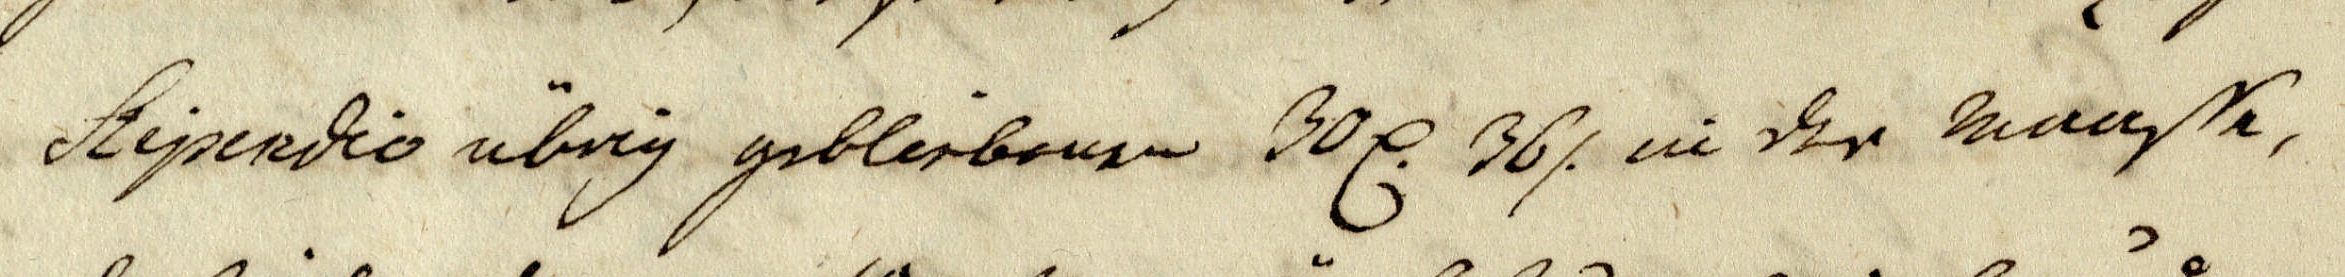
Stipendio übrig gebliebenen 30 l. 36 s. in der Maasse,
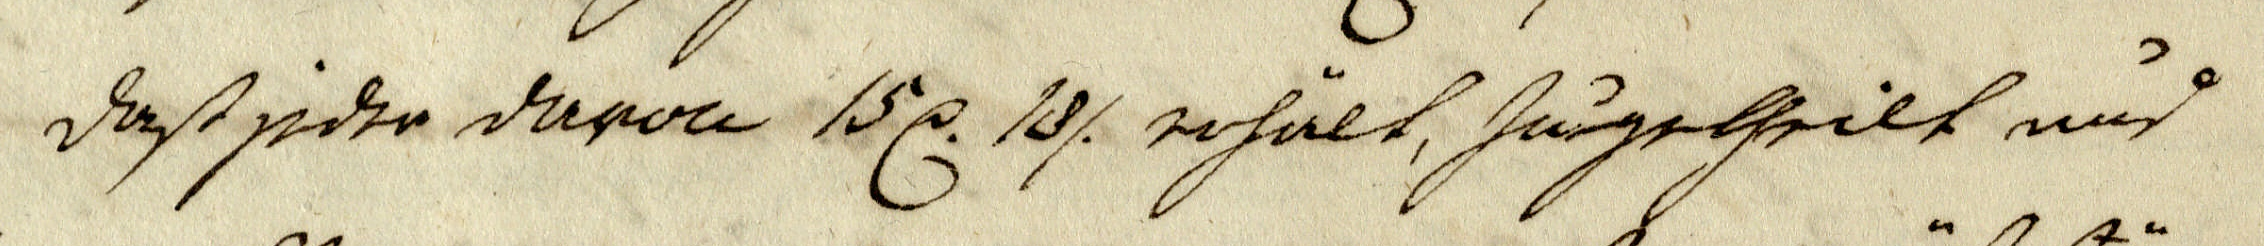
daß jeder davon 15 l. 18 s. erhält, zugetheilt und
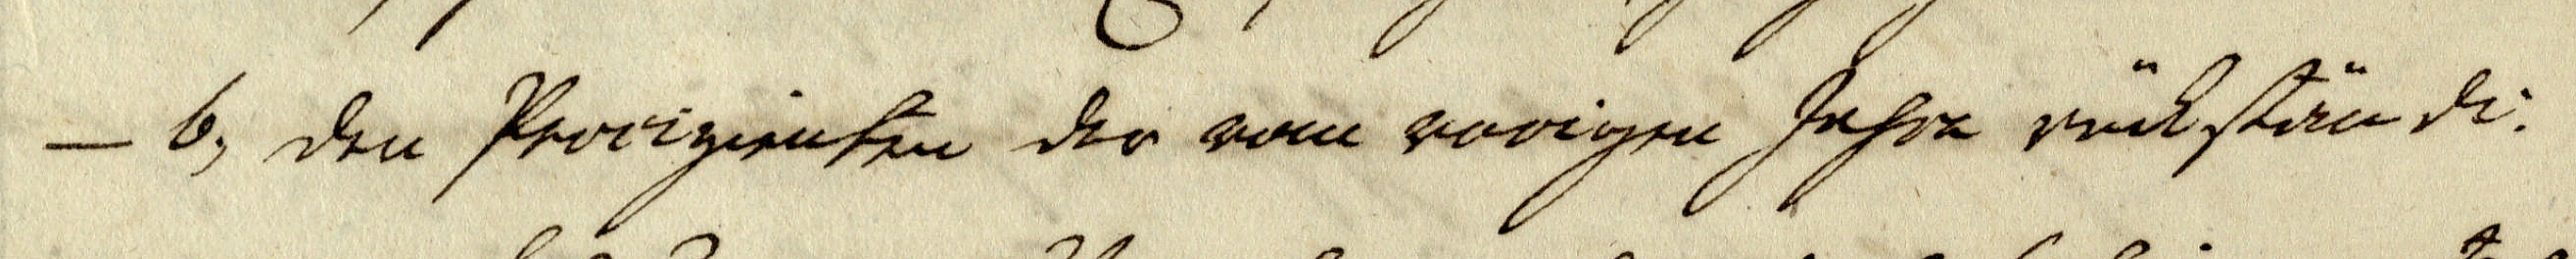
b, den Percipienten der vom vorigen Jahre rückständi¬
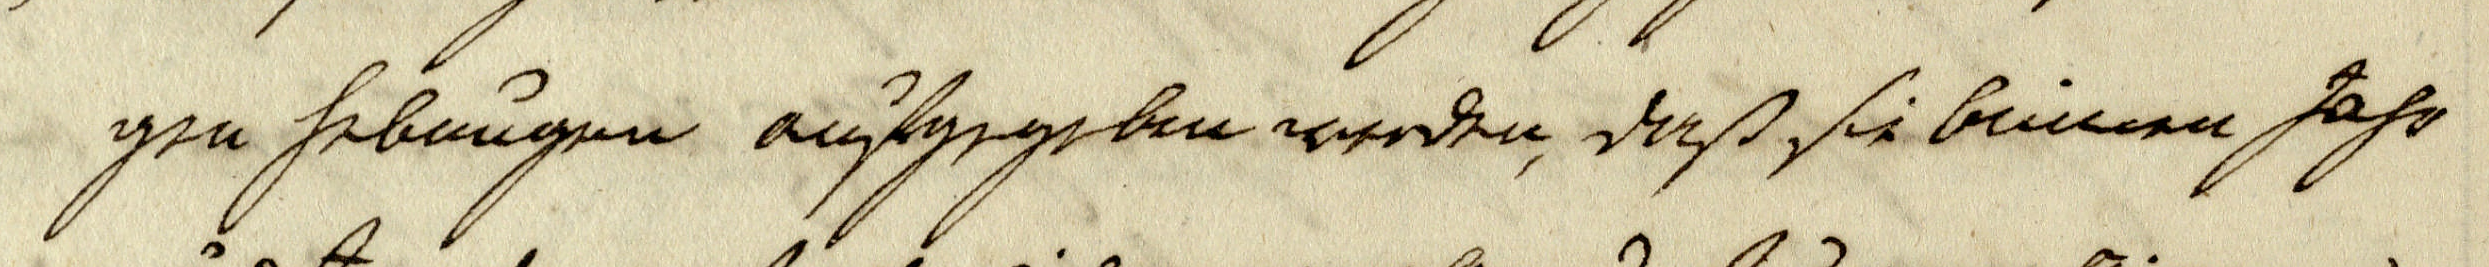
gen Hebungen aufgegeben werden, daß sie binnen Jahr
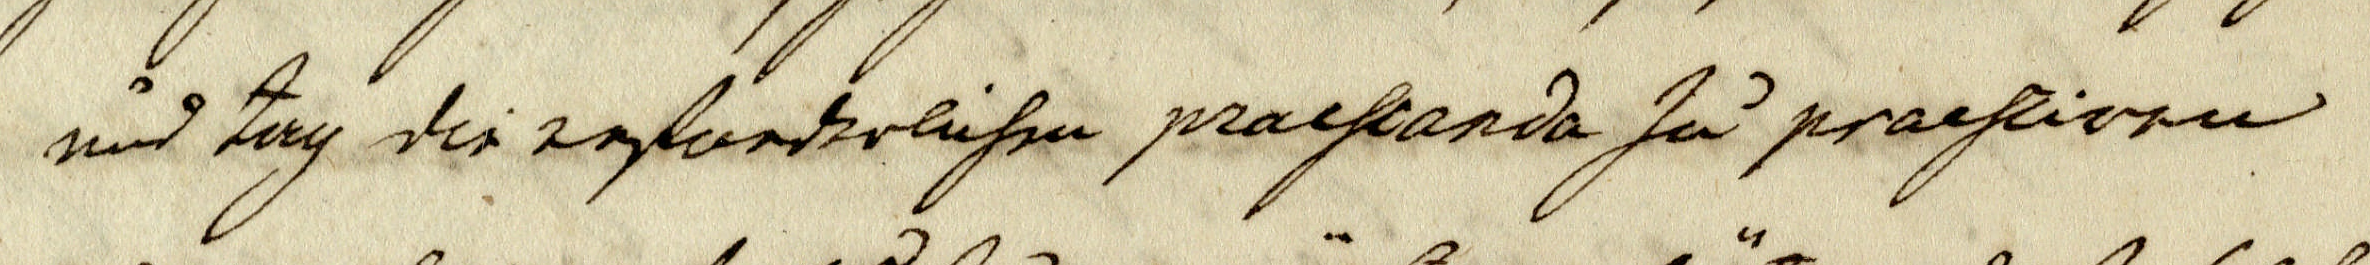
und Tag die erforderlichen praestanda zu praestiren
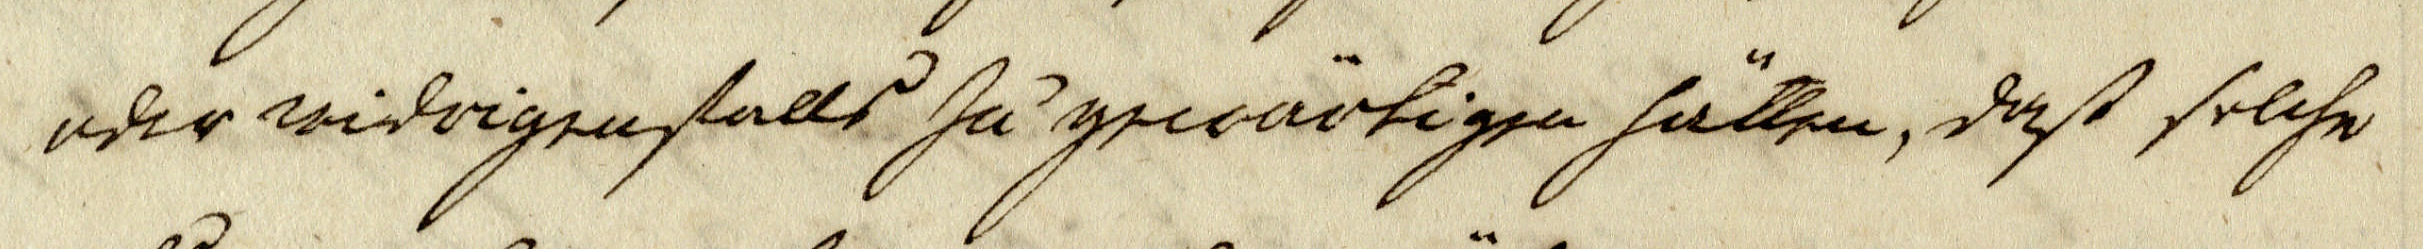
oder widrigenfalls zu gewärtigen hätten, daß solche
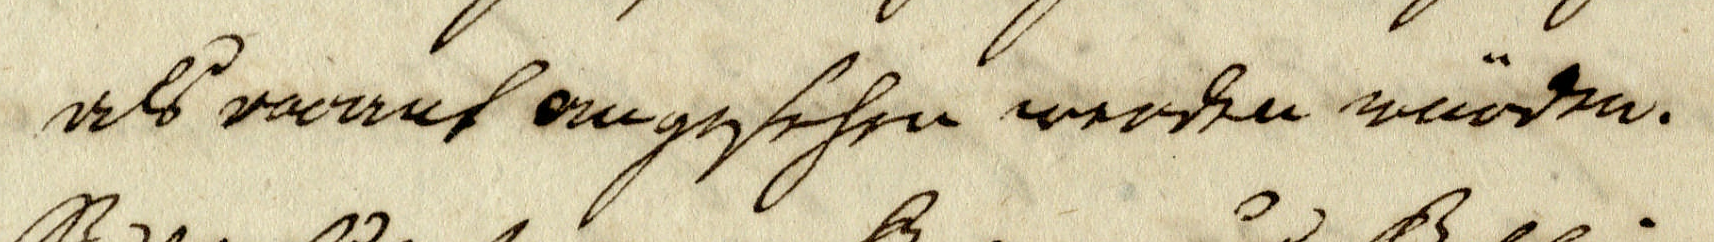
als vacant angesehen werden würden.
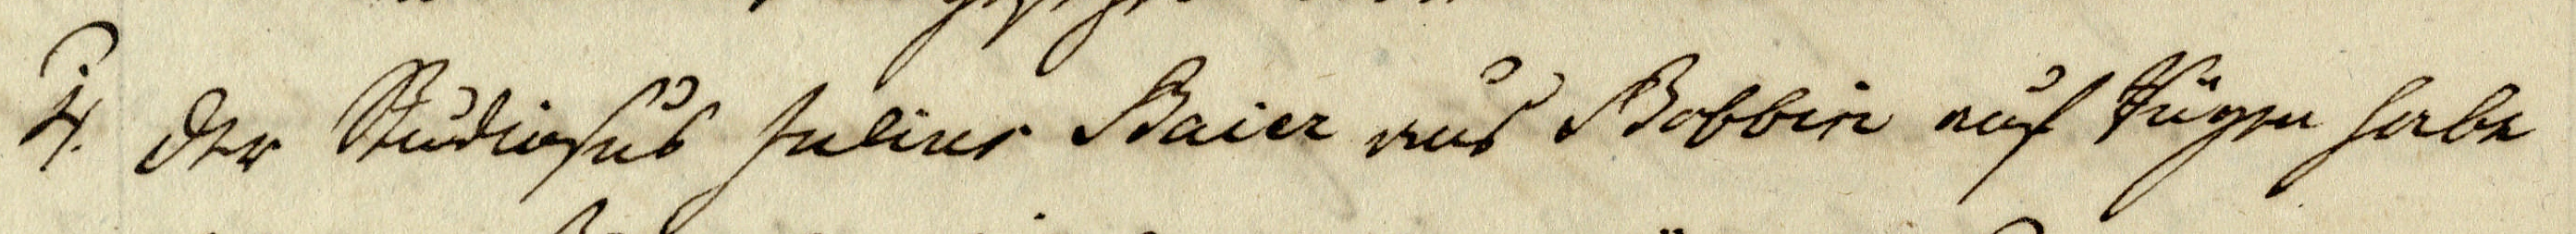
4. Der Studiosus Julius Baier aus Bobbin auf Rügen habe
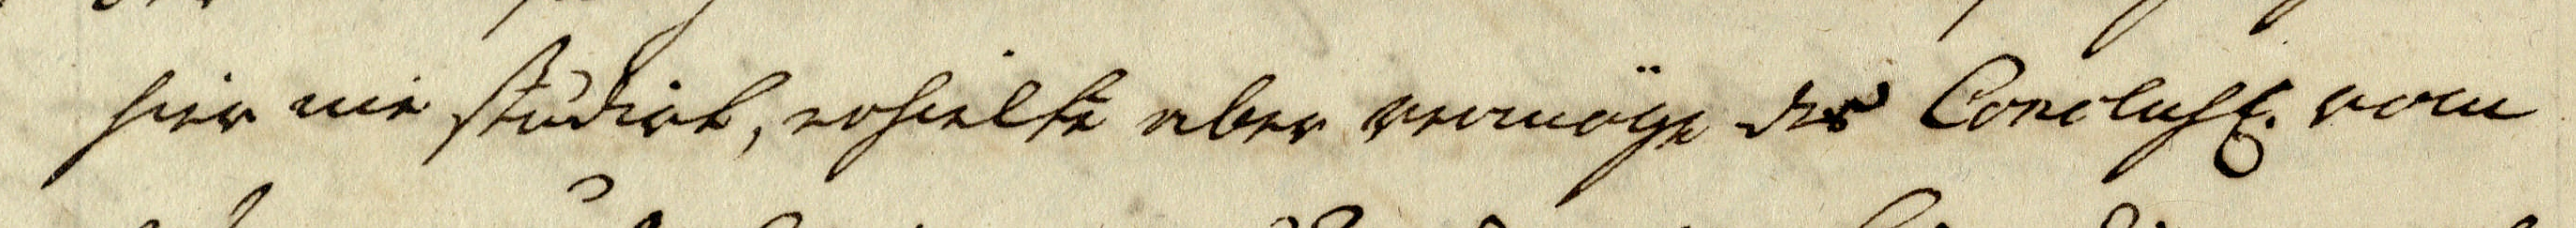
hier nie studirt, erhielte aber vermöge des Conclus. vom
